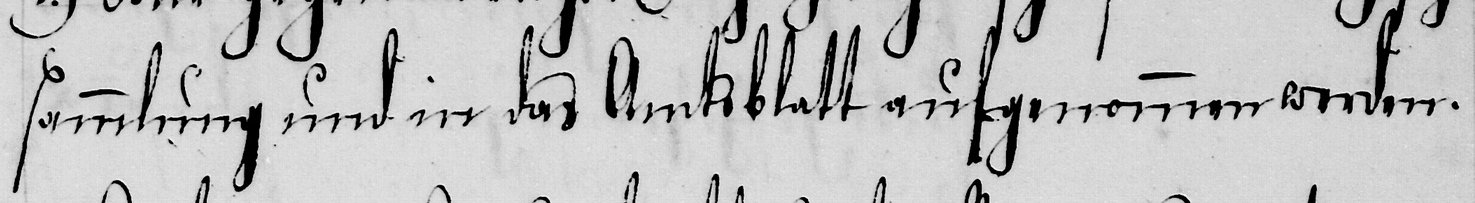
sammlung und in das Amtsblatt aufgenommen werden.
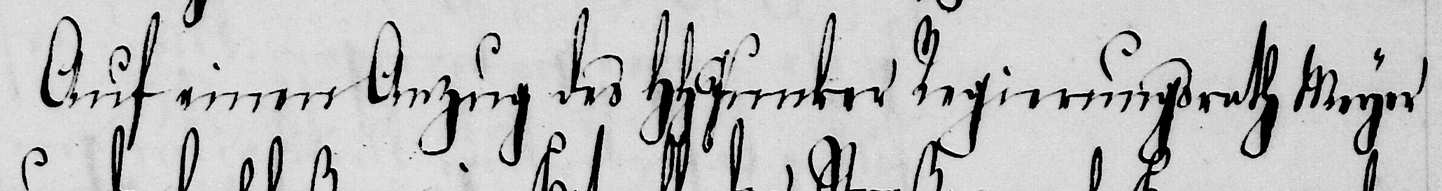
Auf einen Anzug des HHJunker Regierungsrath Meyer
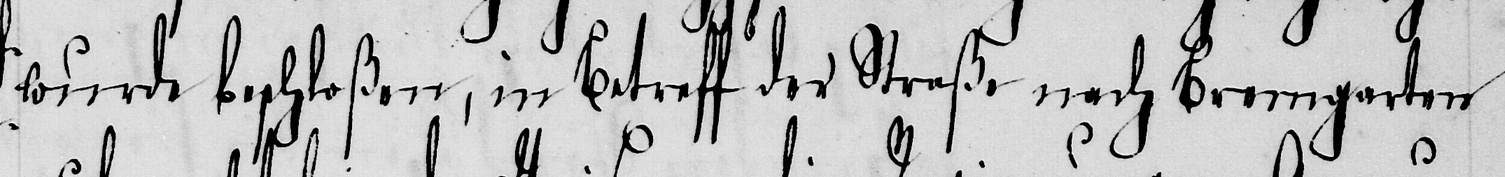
wurde beschloßen, in Betreff der Straße nach Bremgarten
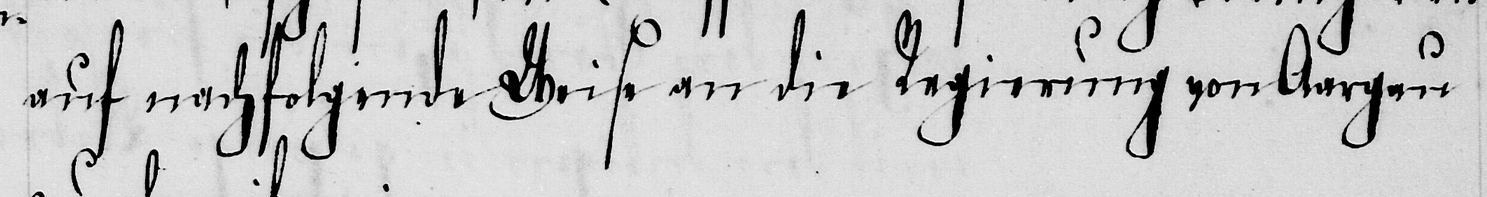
auf nachfolgende Weise an die Regierung von Aargau
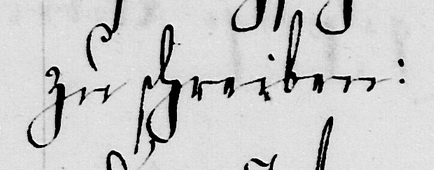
zu schreiben:
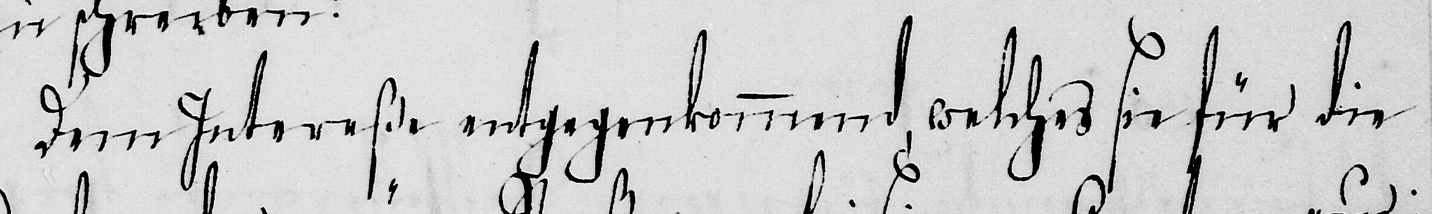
Dem Intereße entgegenkommend, welches sie für die
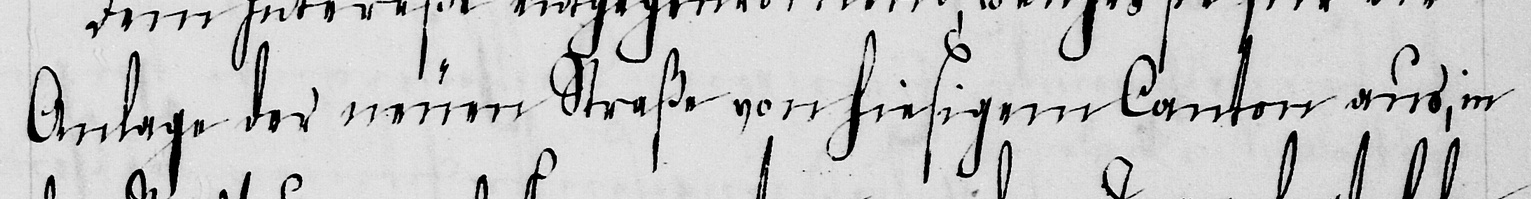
Anlage der neuen Straße von hiesigem Canton aus, in
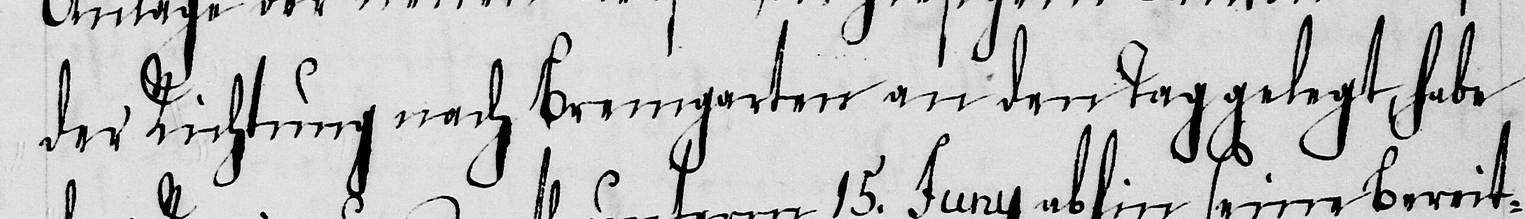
der Richtung nach Bremgarten an den Tag gelegt, habe
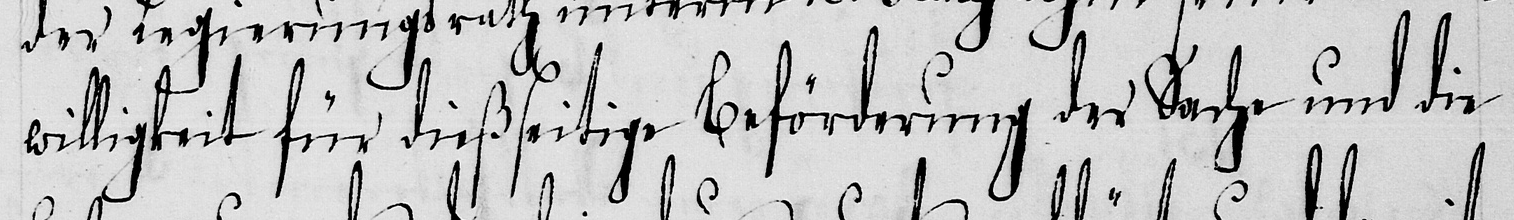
illigkeit für dießseitige Beförderung der Sache und die
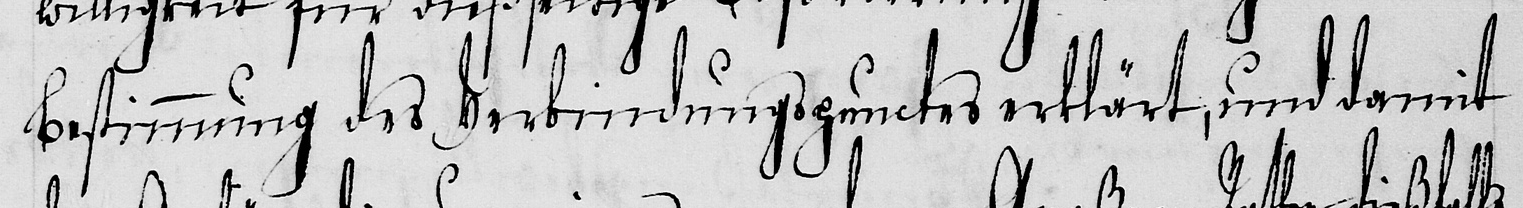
Bestimmung des Verbindungspunctes erklärt, und damit
